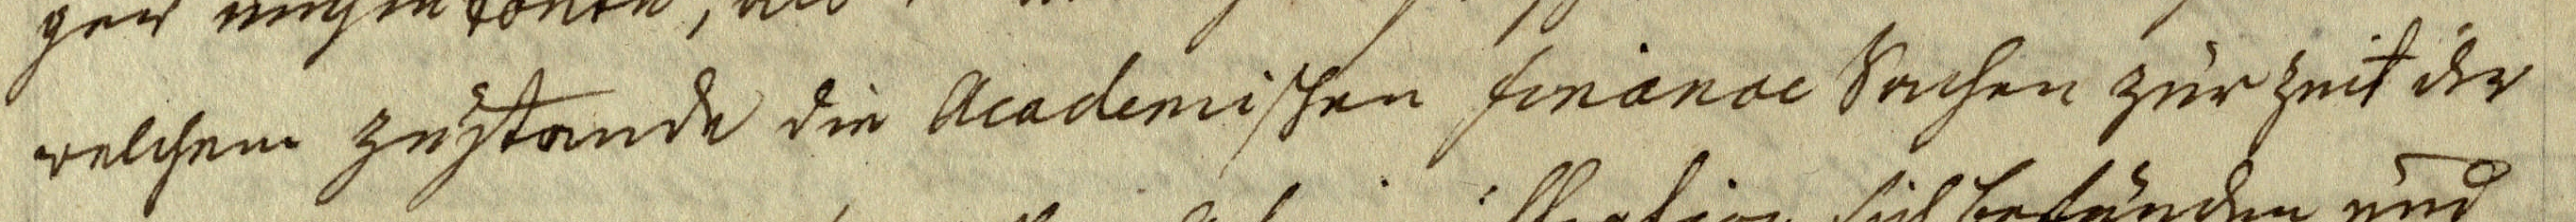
welchem Zustande die Academischen finance Sachen zur zeit der
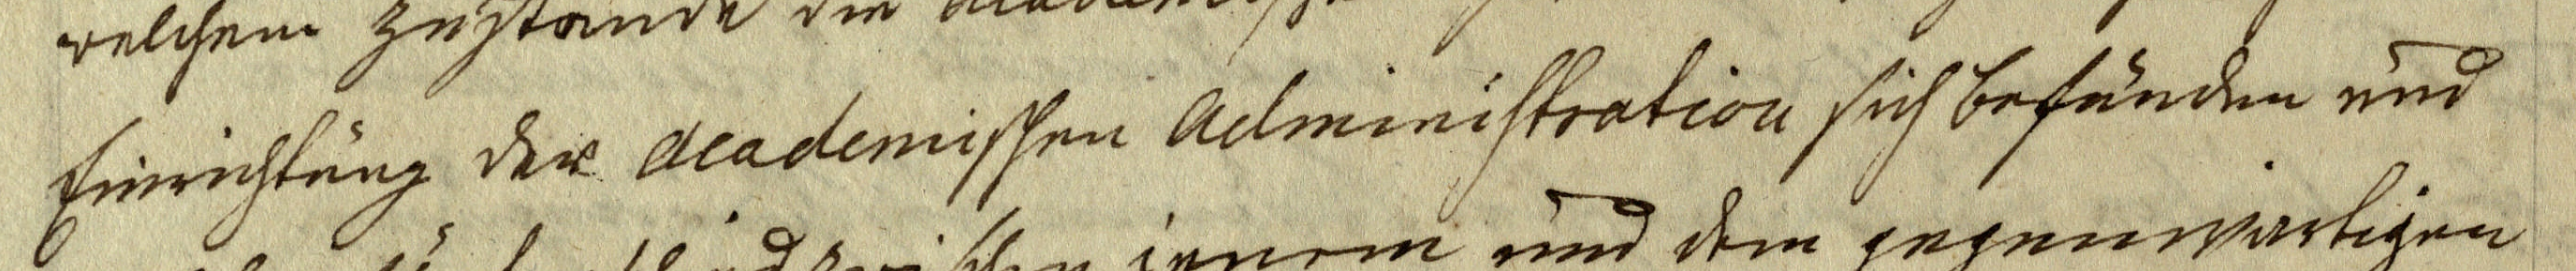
Einrichtung der Academischen Administration sich befunden und
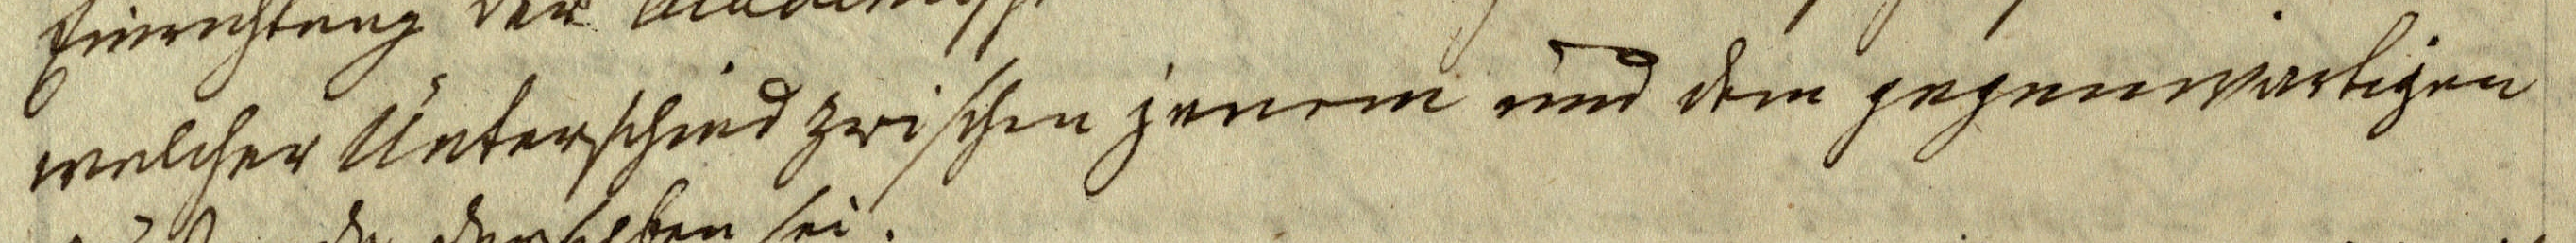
welcher Unterschied zwischen jenem und dem gegenwärtigen
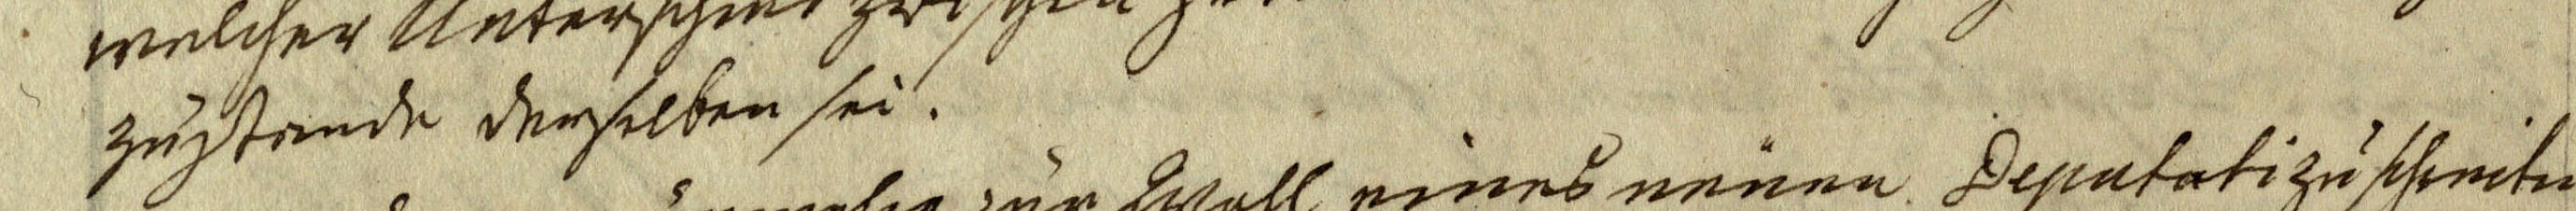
Zustande derselben sei.
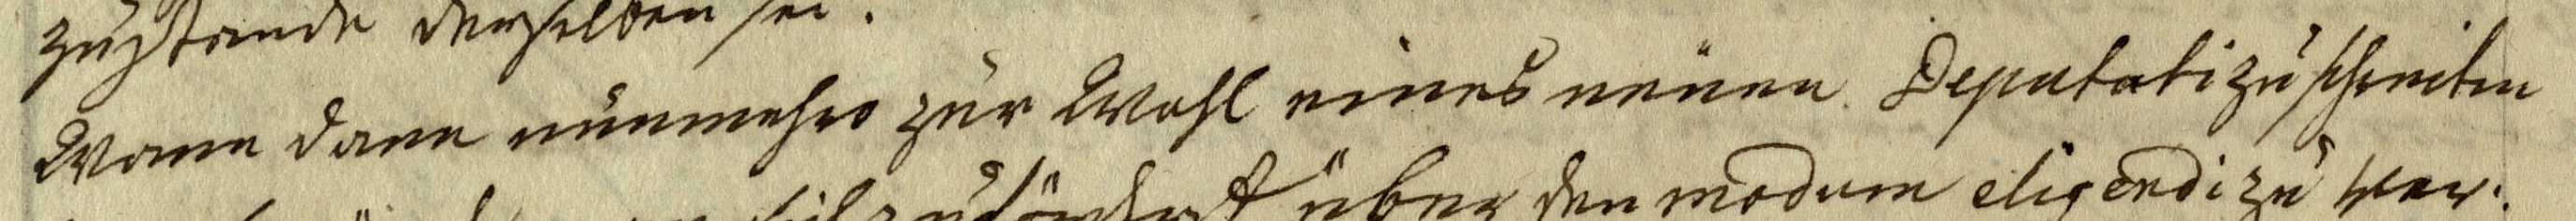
Wann dann nunmehro zur Wahl eines neuen Deputati zu schreiten
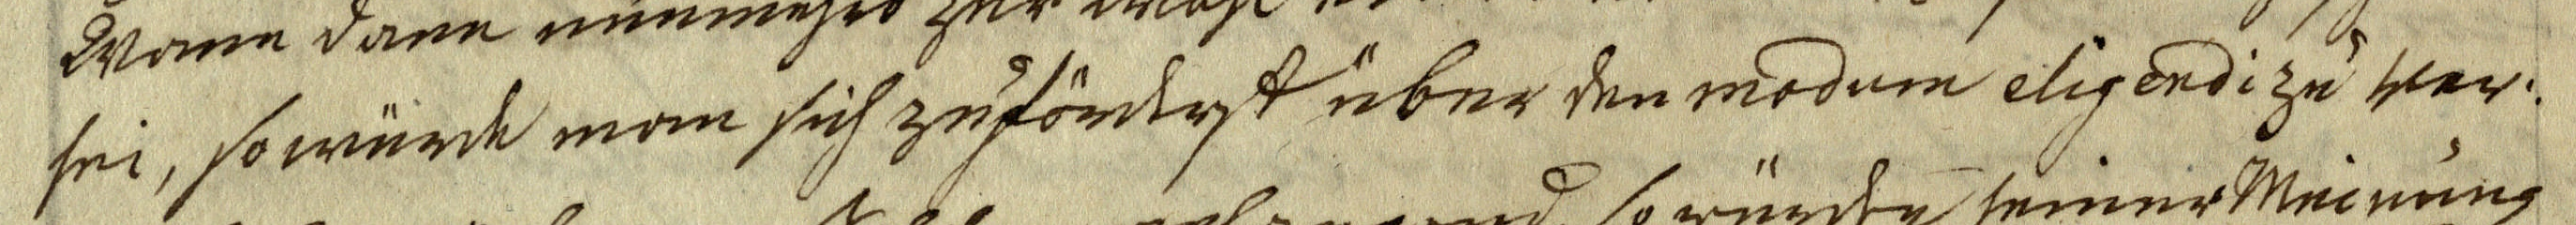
sei, so würde man sich zuförderst über den modum eligendi zu ver¬
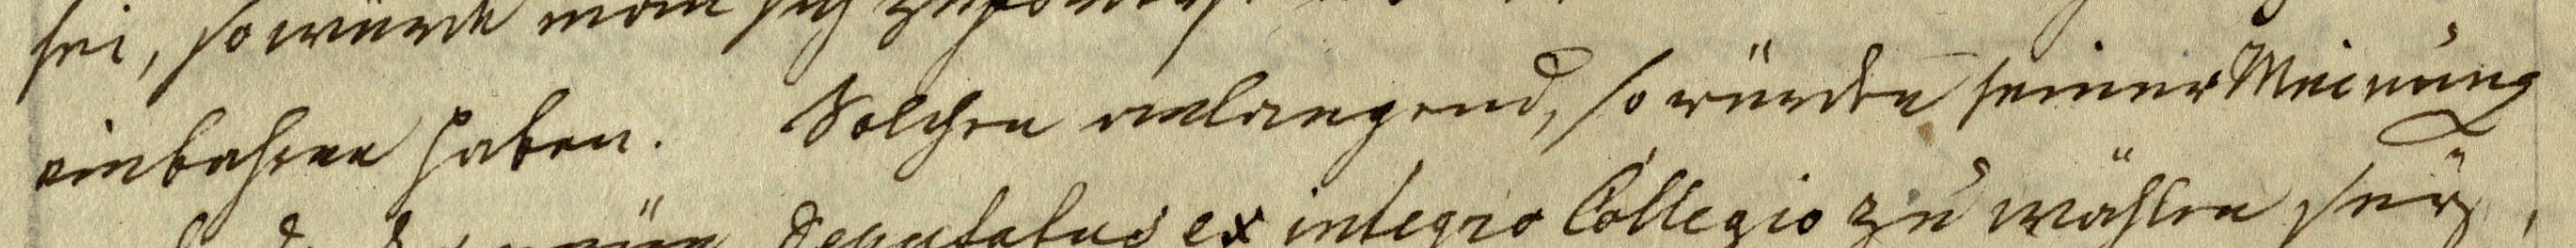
einbahren haben. Solchen verlangend, so würde seiner Meinung
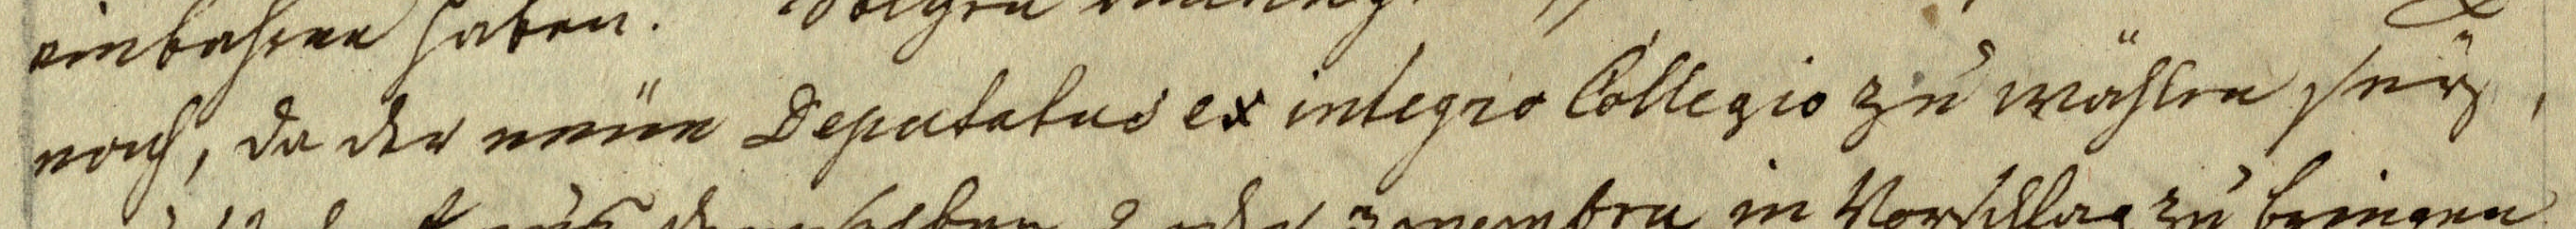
nach, da der neue Deputatus ex integro Collegio zu wählen seÿ,
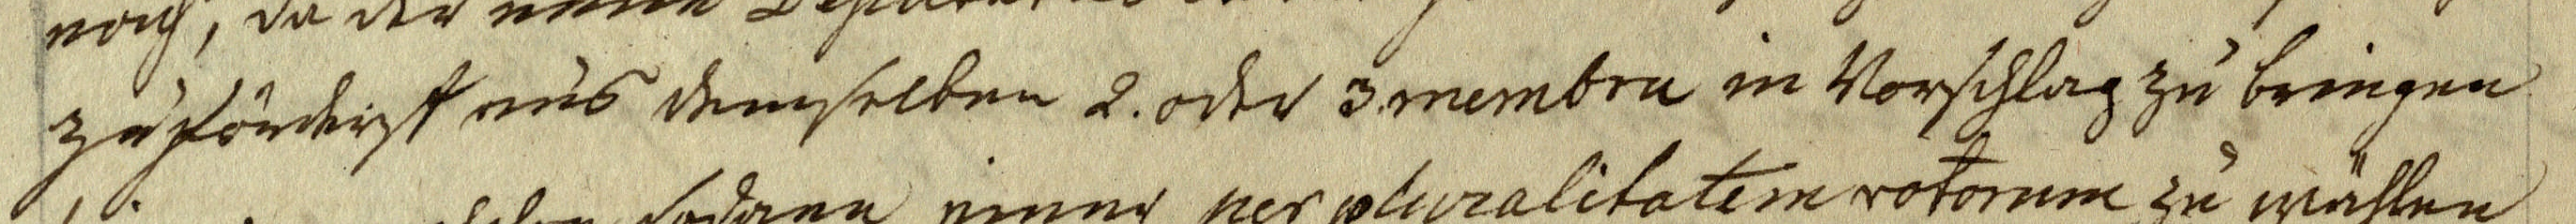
zuförderst aus demselben 2. oder 3. membra in Vorschlag zu bringen
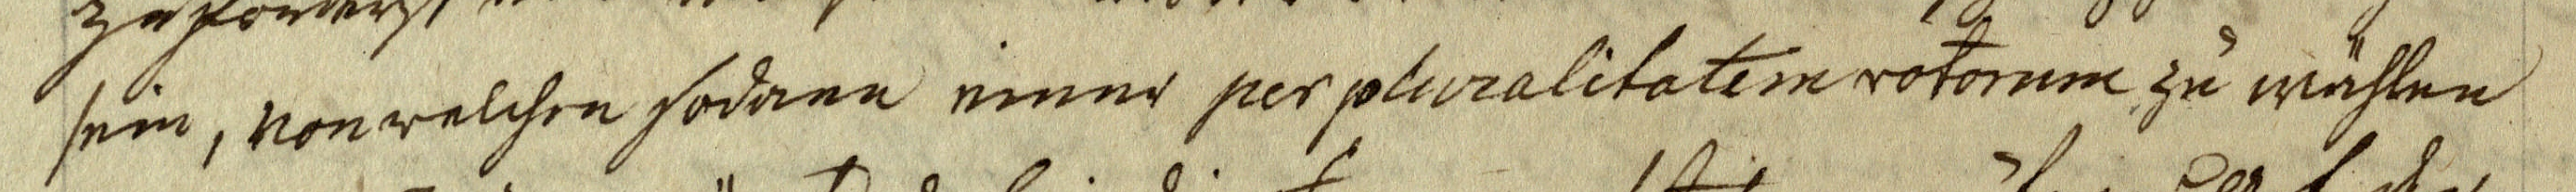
sein, von welchen sodann einer per pluralitatem votorum zu wählen
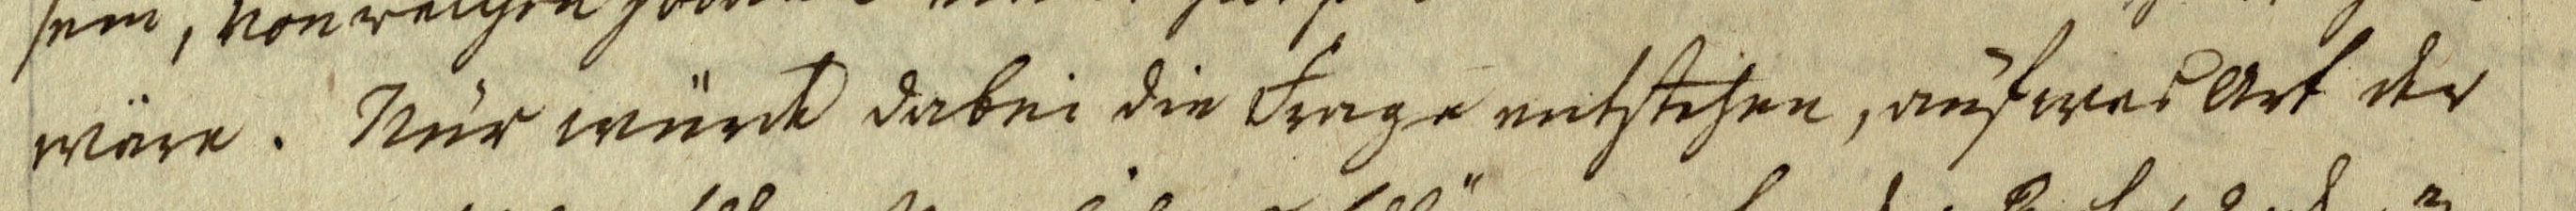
wäre. Nur würde dabei die Frage entstehen, auf was Art der
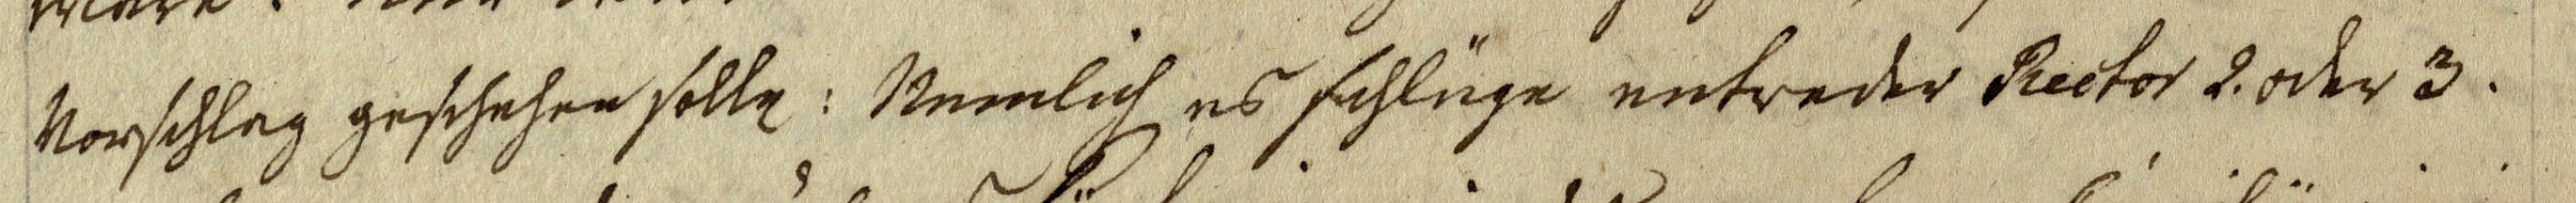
Vorschlag geschehen solle: Nemlich es schlüge entweder Rector 2. oder 3.
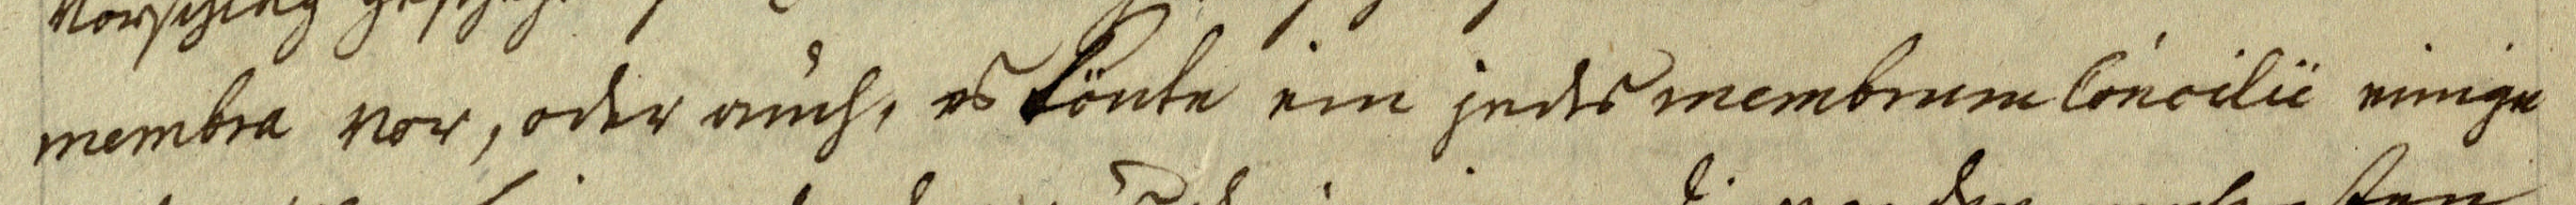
membra vor, oder auch, es könte ein jedes membrum Concilii einige
